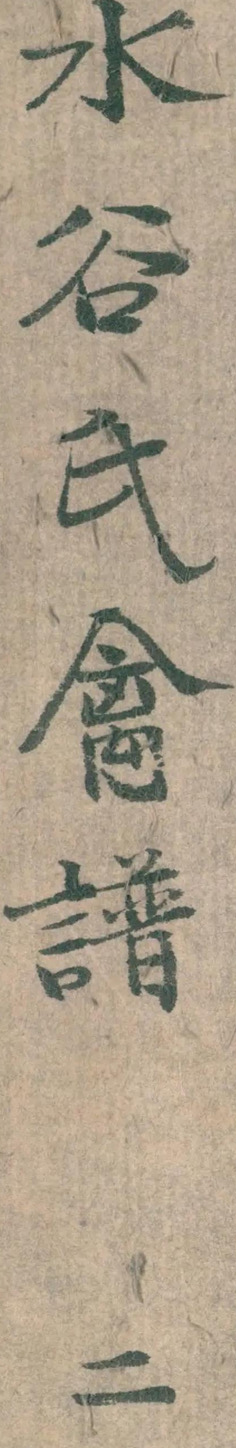水谷氏禽譜二

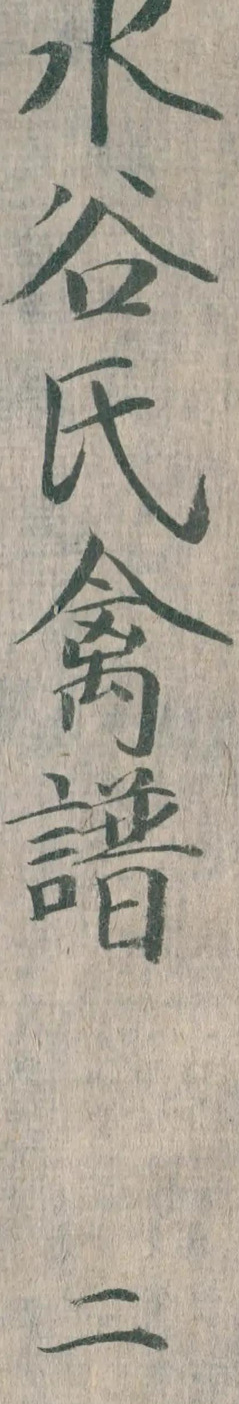水谷氏禽譜二

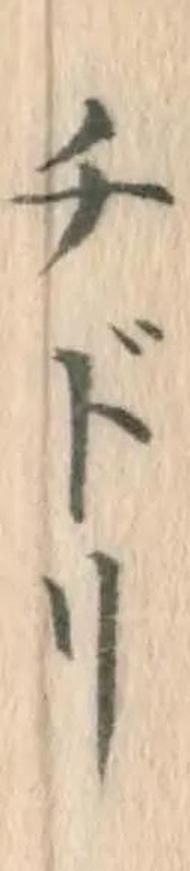チドリ
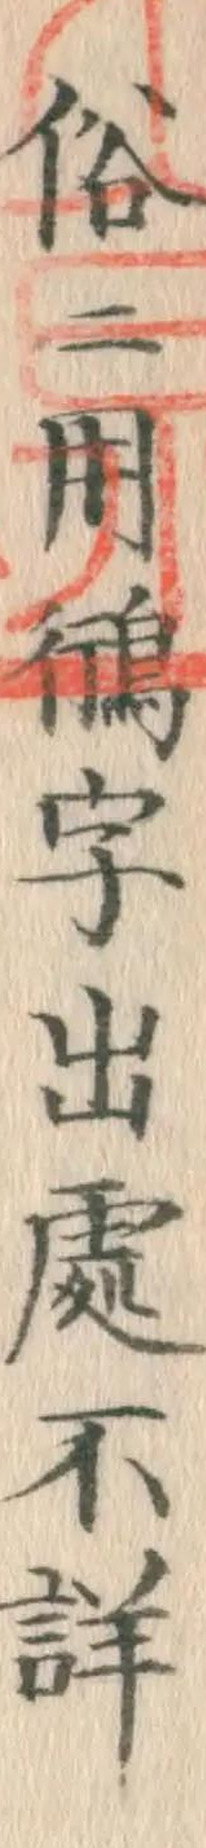俗ニ用鴴字出處不詳
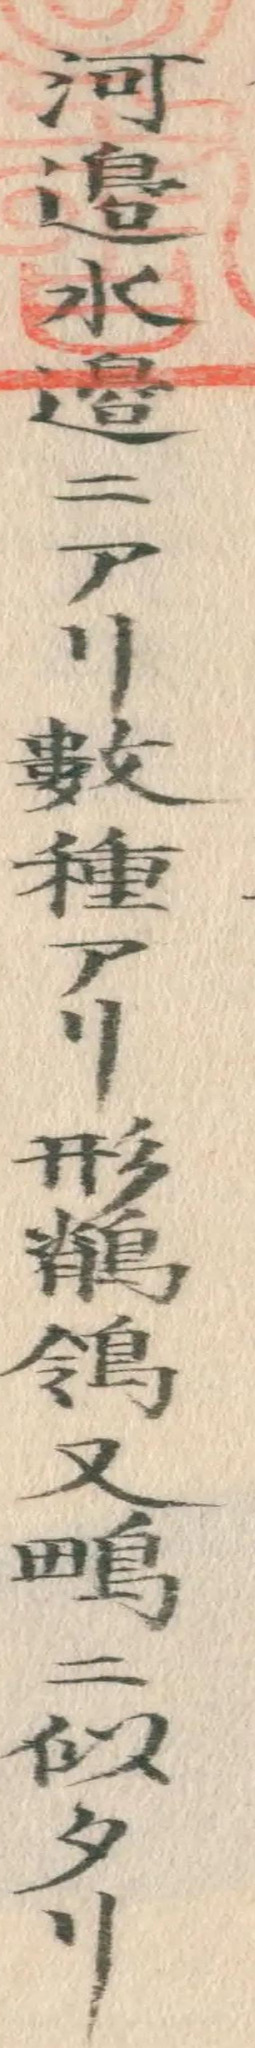河邉水邉ニアリ數種アリ形鶺鴒又鴫ニ似タリ

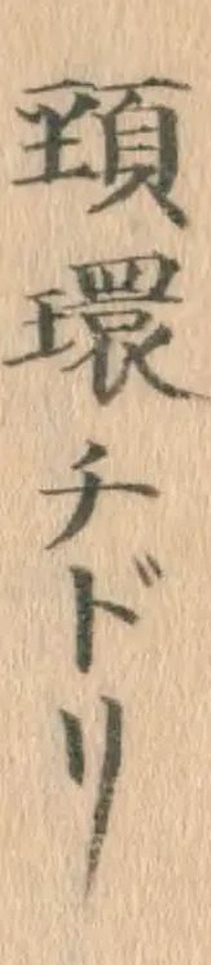頸環チドリ
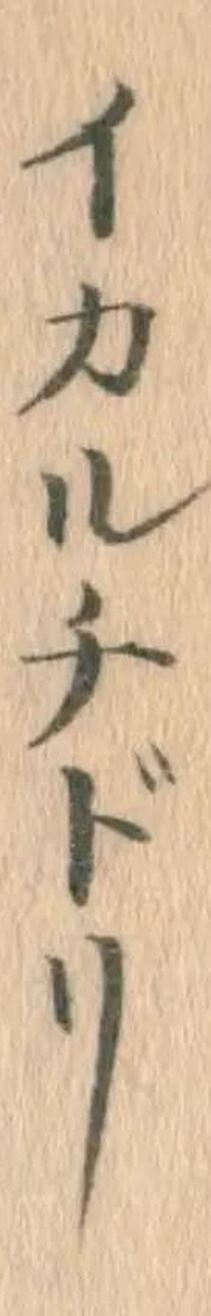イカルチドリ
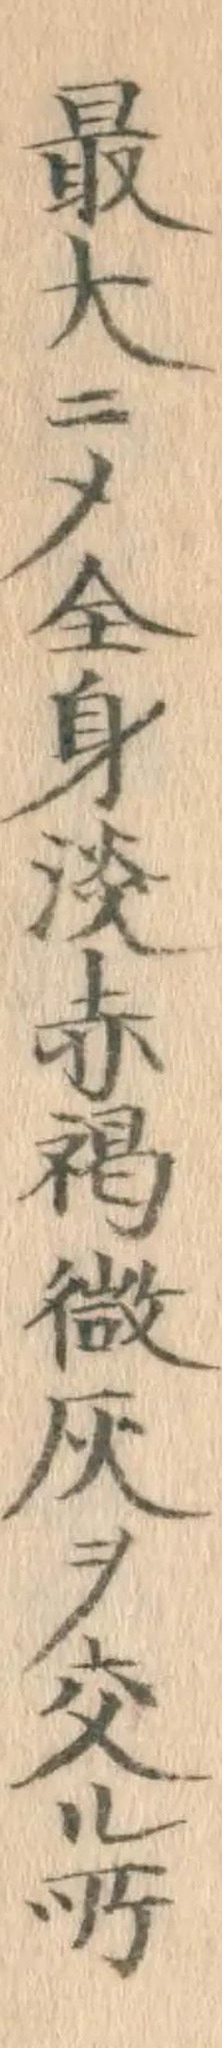最大ニシテ全身淡赤褐微灰ヲ交ル所
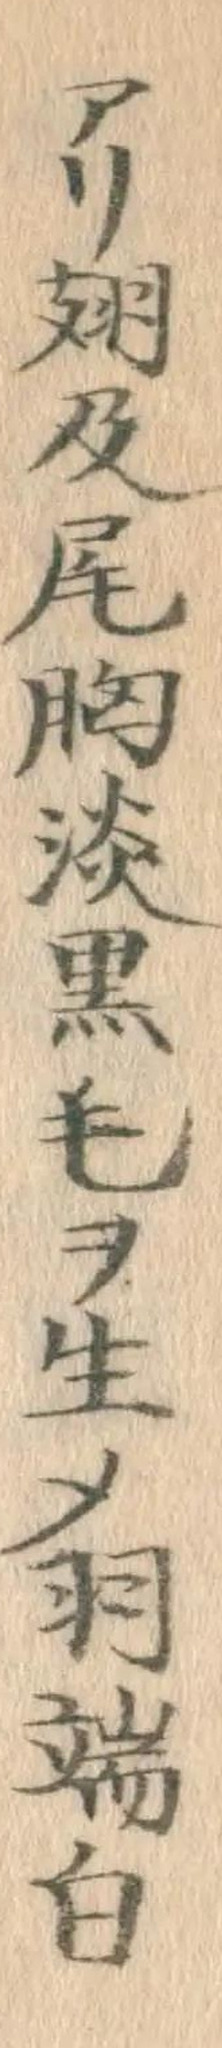アリ翅及尾胸淡黒毛ヲ生シテ羽端白
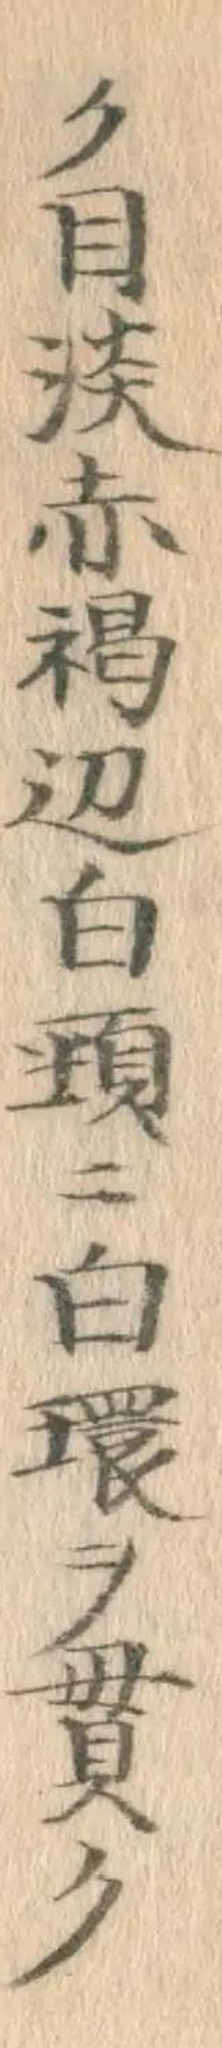ク目淡赤褐色辺白頸ニ白環ヲ貫ク
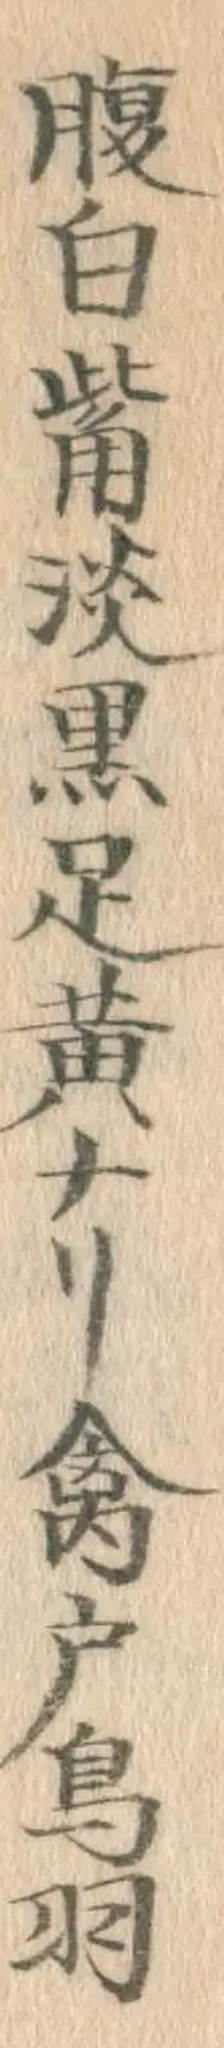腹白觜淡黒足黄ナリ禽戸鳥羽
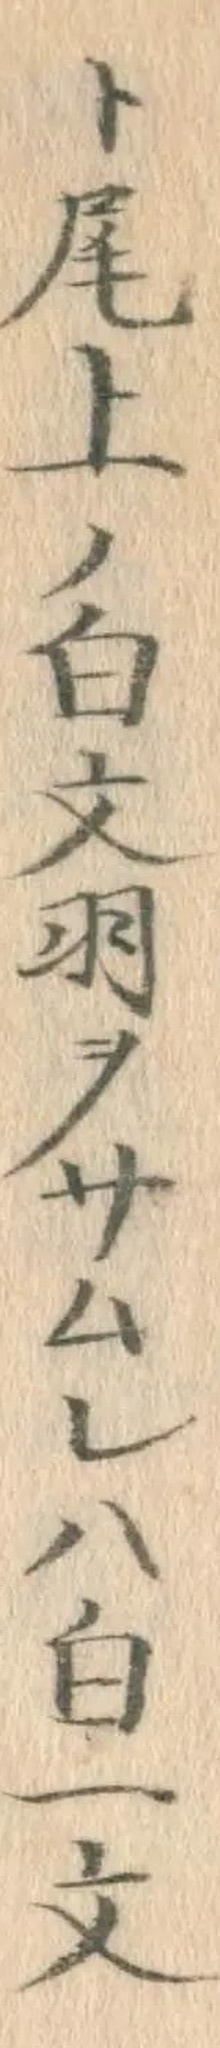ト尾上ノ白文羽ヲサムレハ白一文
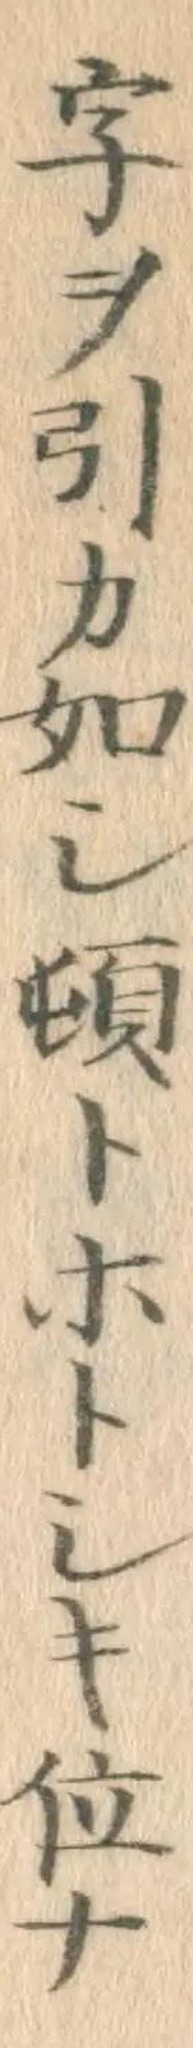字ヲ引カ如シ頓トホトシキ位ナ
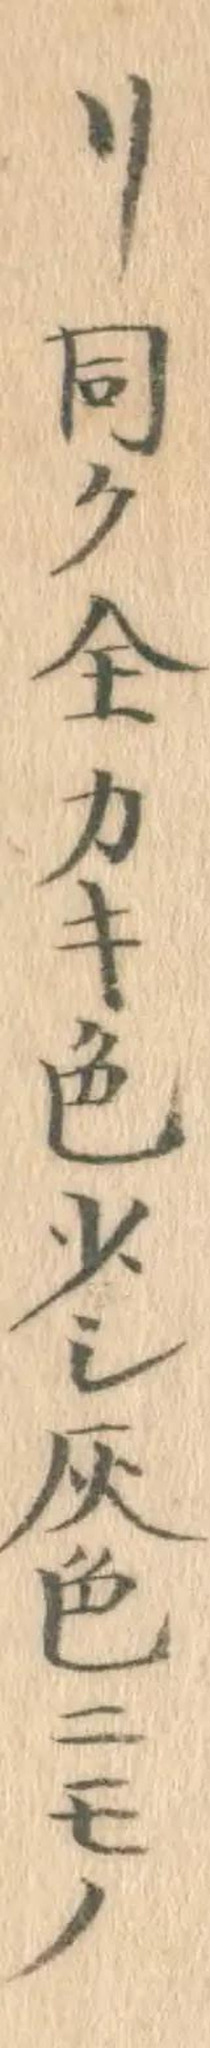リ同ク全カキ色少シ灰色ニモノ
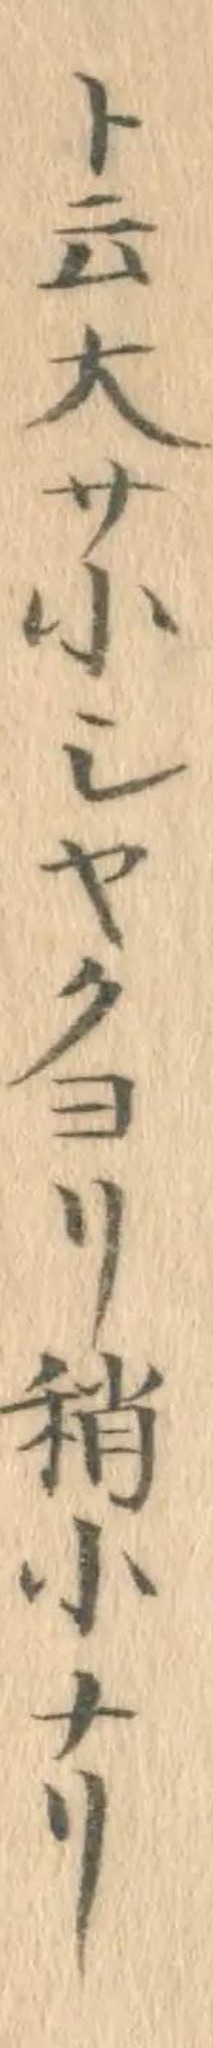ト云大サ少シヤクヨリ稍小ナリ

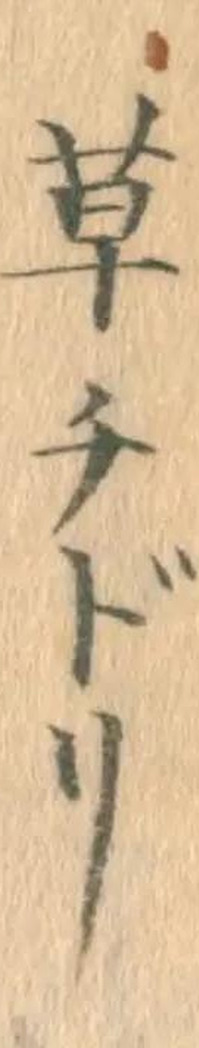草チドリ
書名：水谷禽譜. [2]
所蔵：国立国会図書館 National Diet Library, JAPAN
